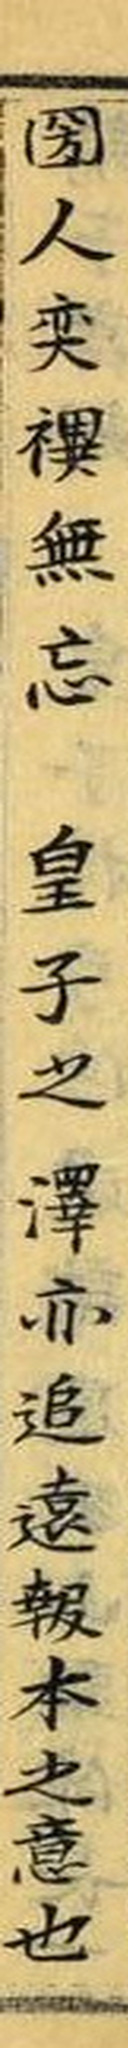圀人奕禩無忘皇子之澤亦追遠報本之意也

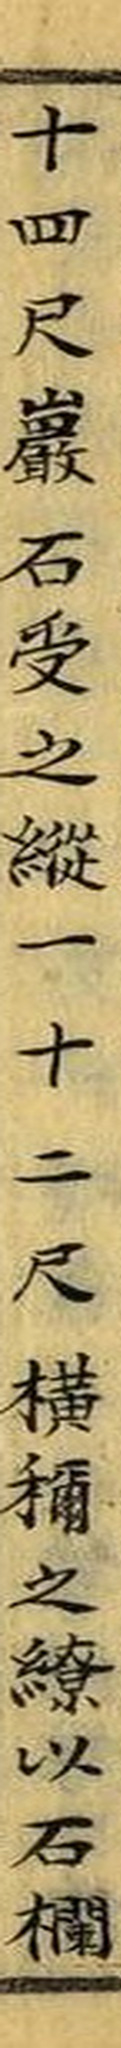十四尺巖石受之縦一十二尺横稱之繚以石欄
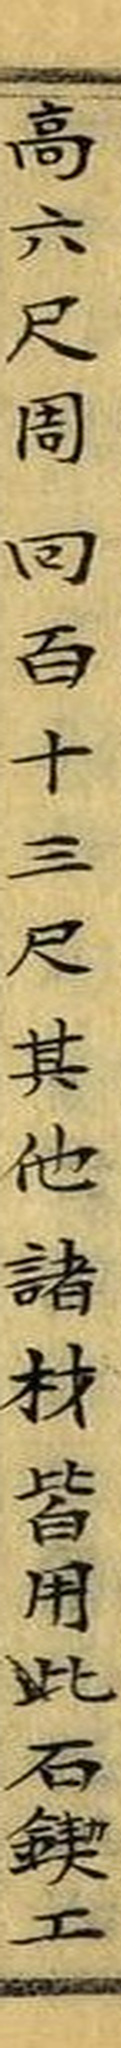高六尺周囘百十三尺其他諸材皆用此石鍥工
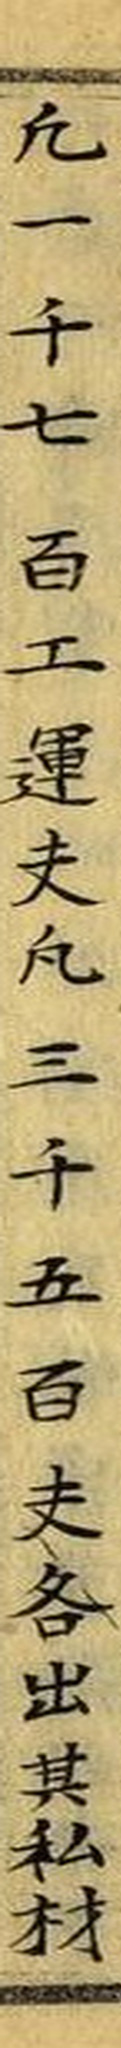凡一千七百工運夫凡三千五百夫各出其私材
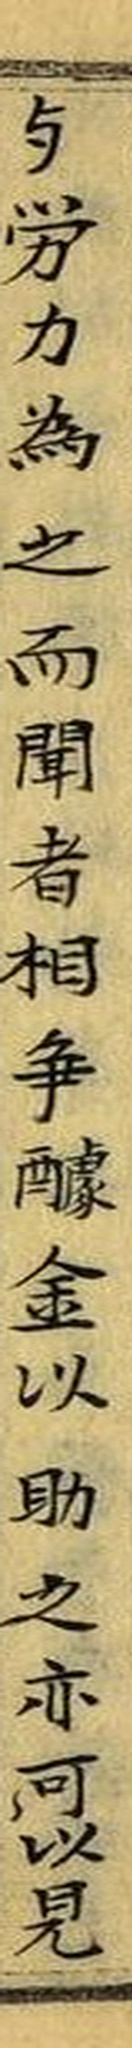与労力為之而聞者相争醵金以助之亦可以見
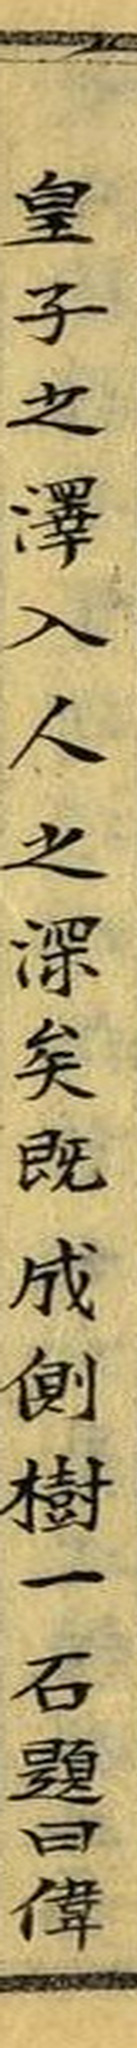皇子之澤入人之深矣既成側樹一石題曰偉
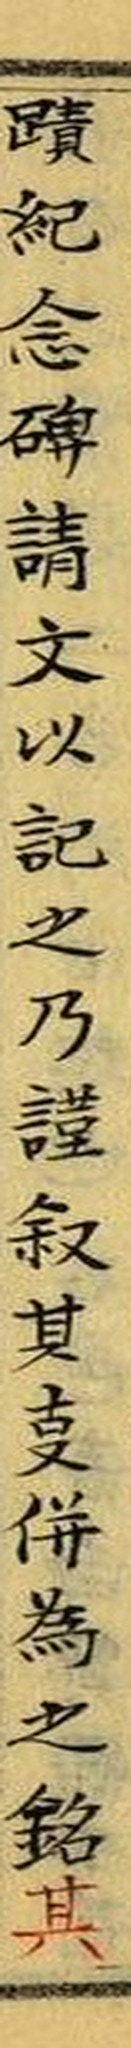蹟紀念碑請文以記之乃謹叙其叓併為之銘其
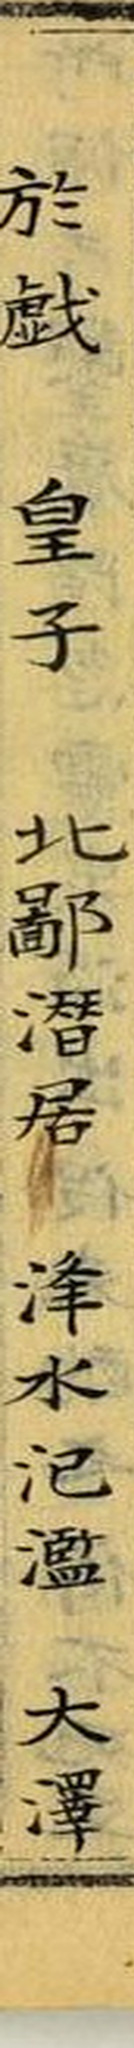於戯皇子北鄙潜居洚水氾濫大澤
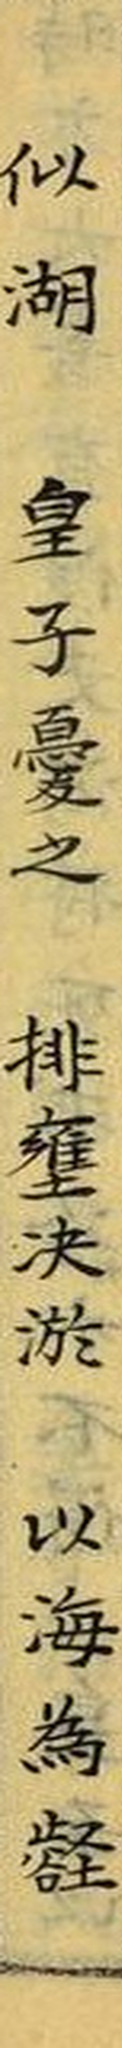似湖皇子憂之拝壅決游以海為壑
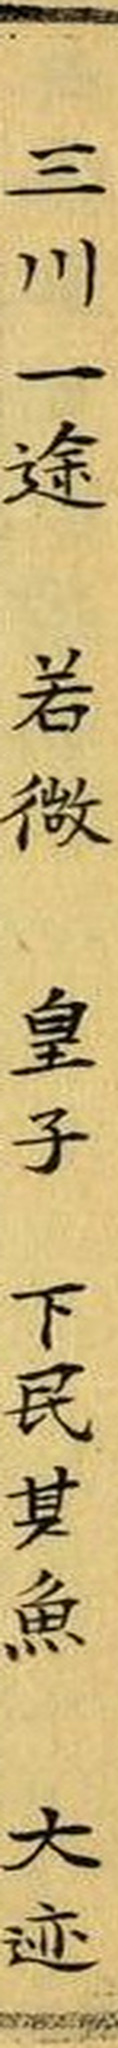三川一途若微皇子下民其魚大迹
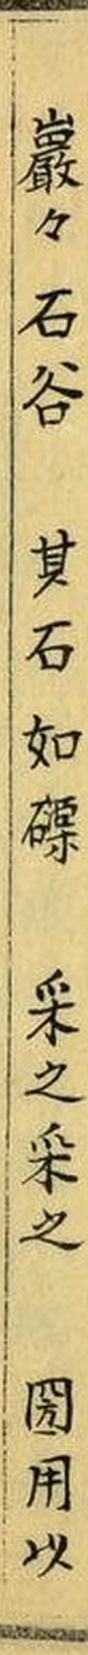巖々石谷其石如磲采之采之圀用以
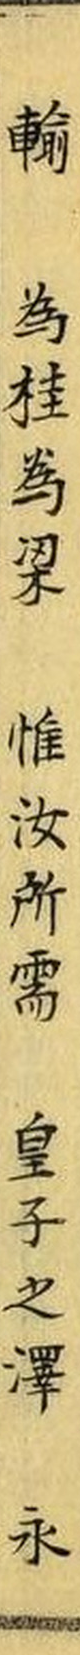輸為桂為梁惟汝所需皇子之澤永
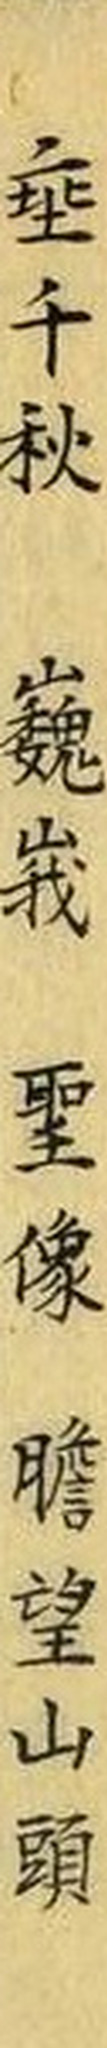垂千秋巍峩聖像膽望山頭
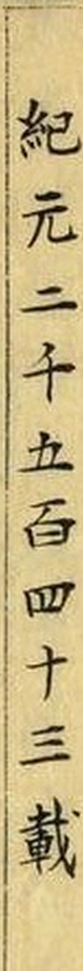紀元二千五百四十三載
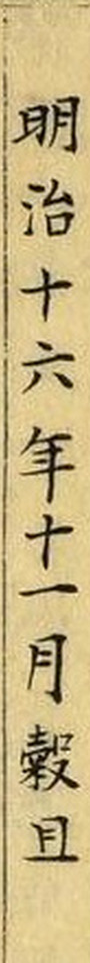明治十六年十一月穀旦
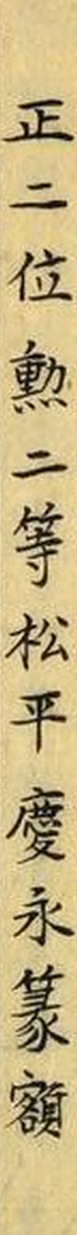正二位勲二等松平慶永篆額
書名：温古集 五巻
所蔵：福井県文書館 Fukui Prefectural Archives
